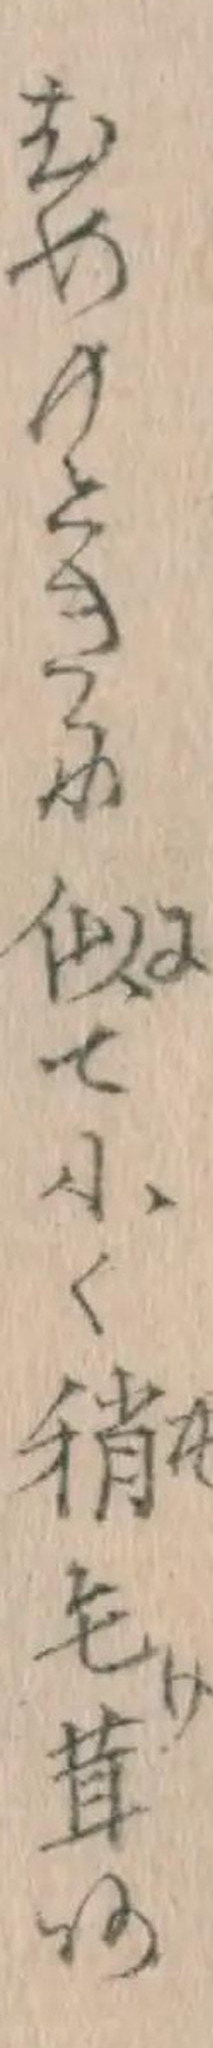むめもときに似て小く稍毛茸あ
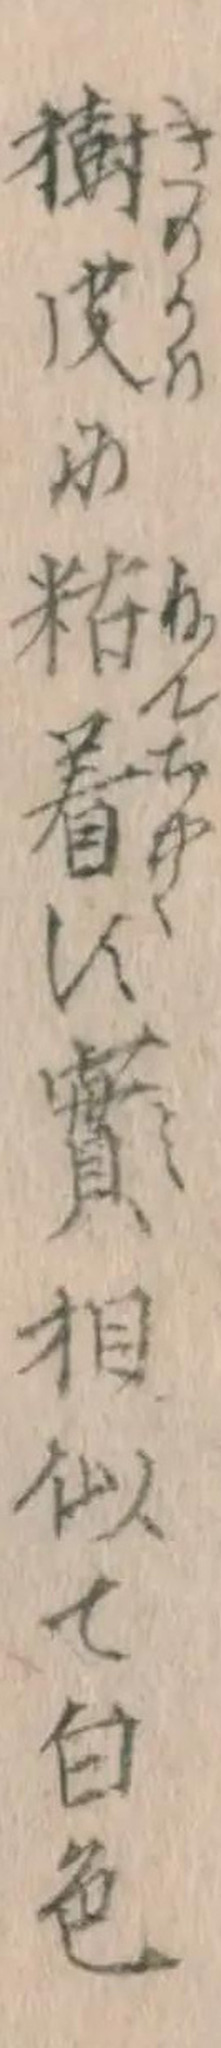樹皮に粘着す実相似て白色
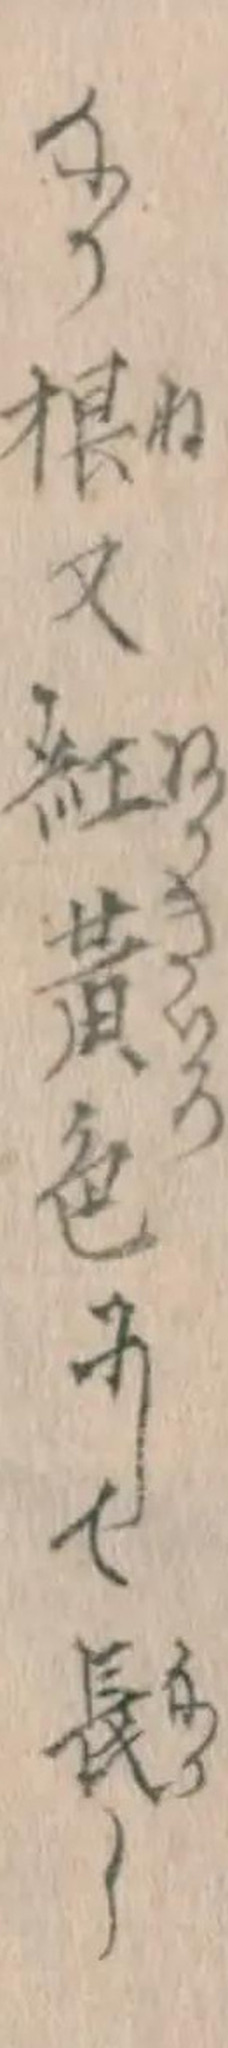なり根又紅黄色にして長し
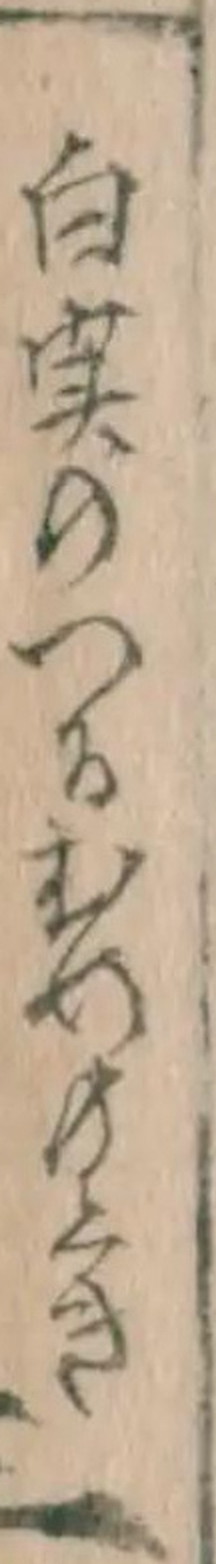白実のつるむめもどき

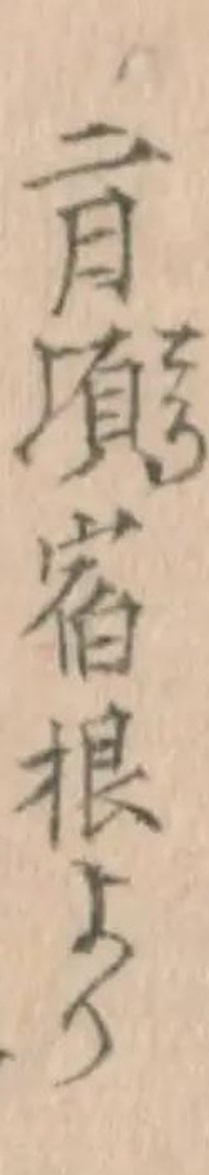二月頃宿根より
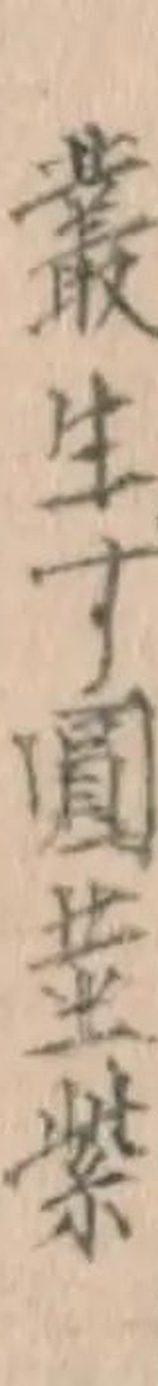叢生す円茎紫
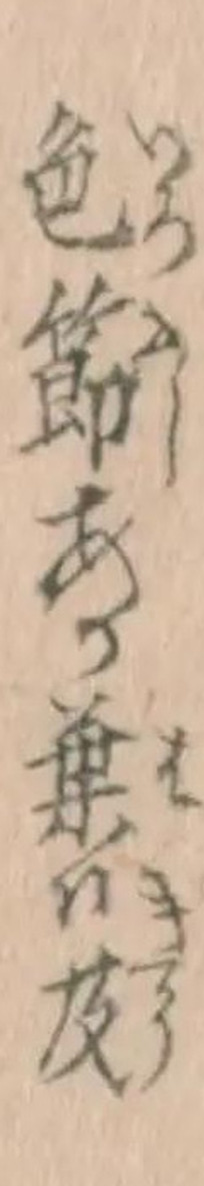色節あり葉は及
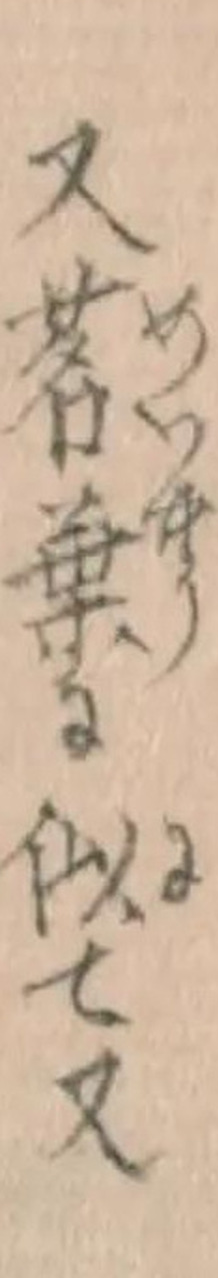又茗葉に似て又
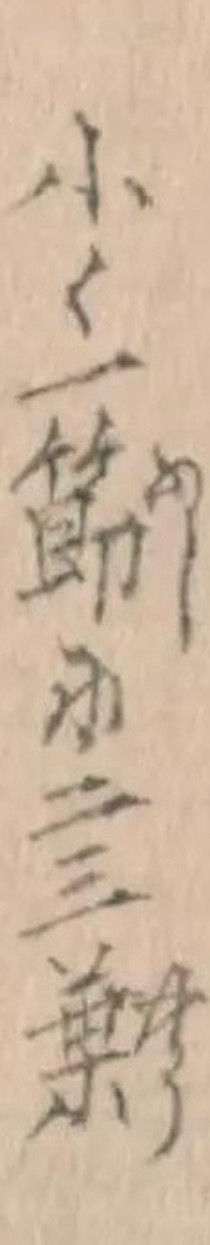小く一節に二三葉
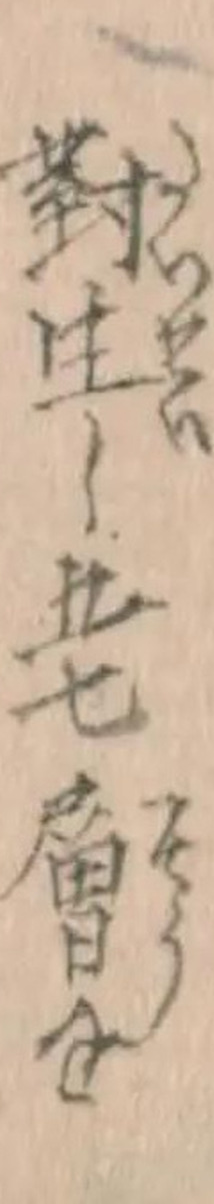対生し五七層を
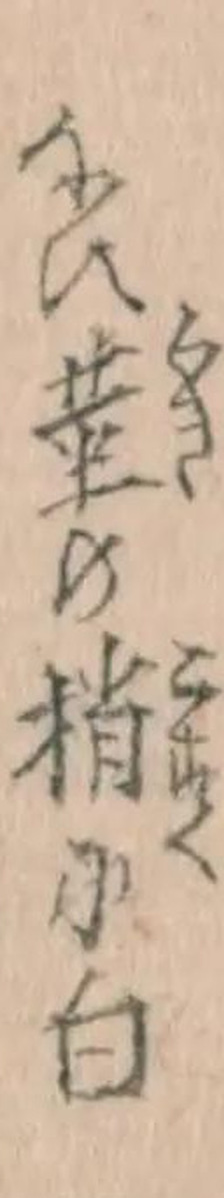なす茎の梢に白
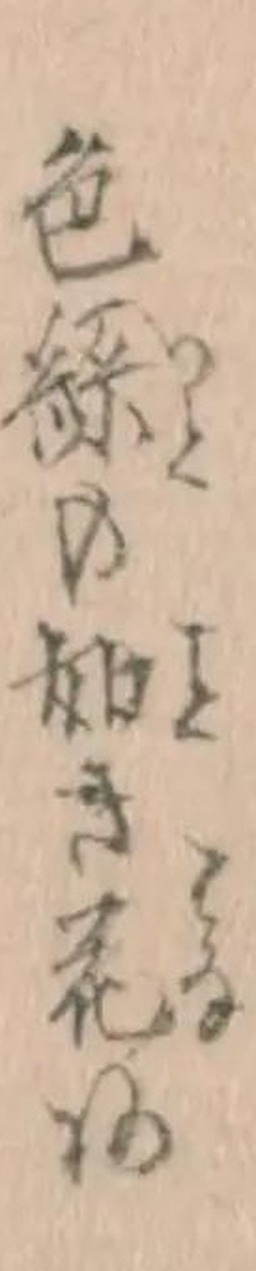色糸の如き花あ
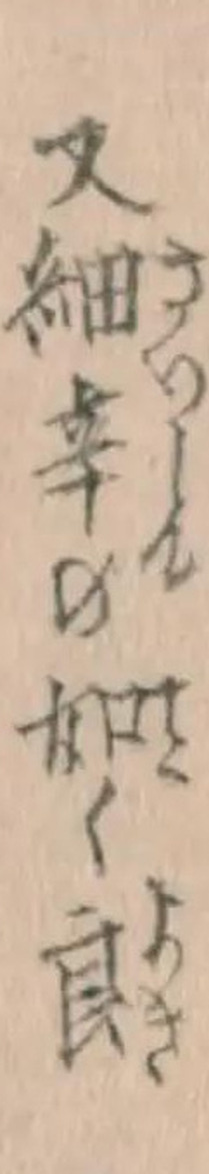又細辛の如く良
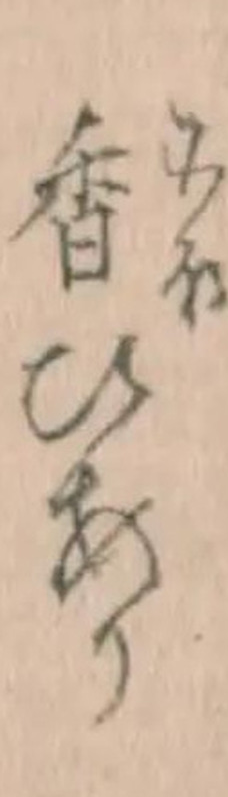香ひあり
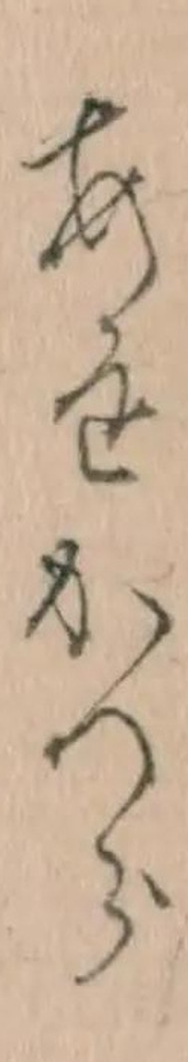あをかつら
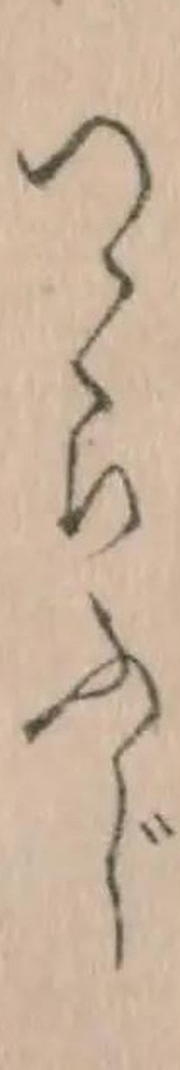つゝらふじ
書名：本草図譜. 巻28-30
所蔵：国立国会図書館 National Diet Library, JAPAN
